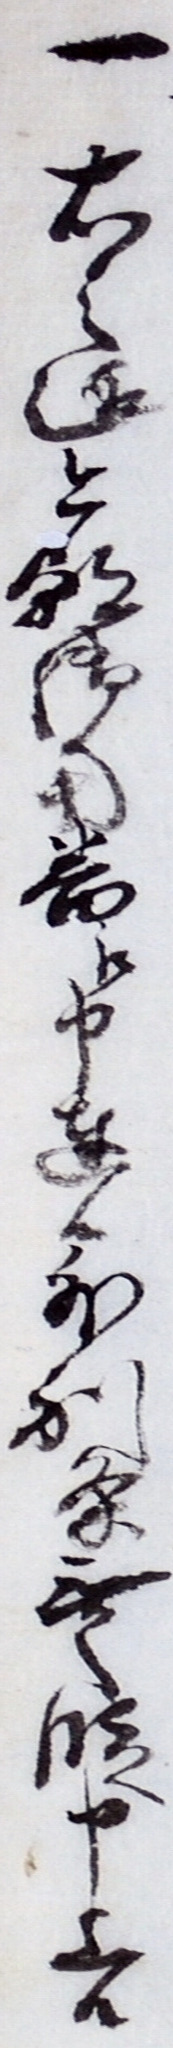一右之趣今朝御用番江申達候外別条無之段へ申上ル
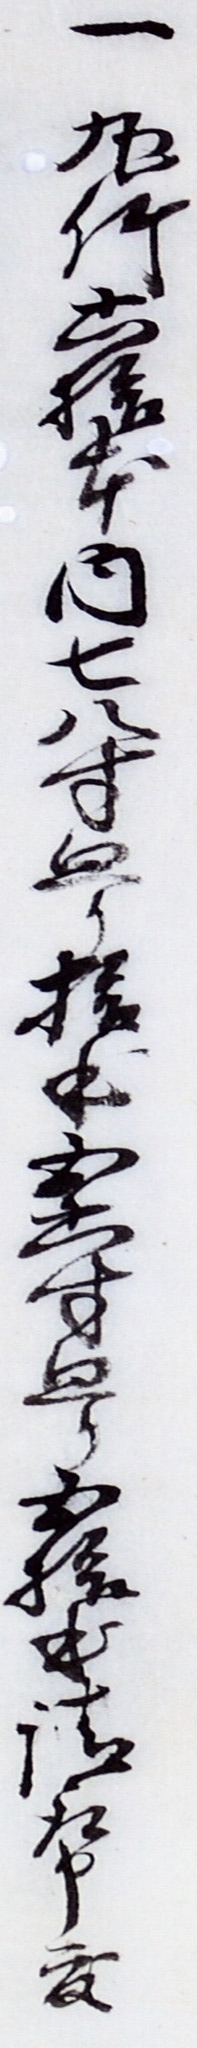一丸竹六拾本内七八寸廻り拾本五六寸廻り五拾本請取申度
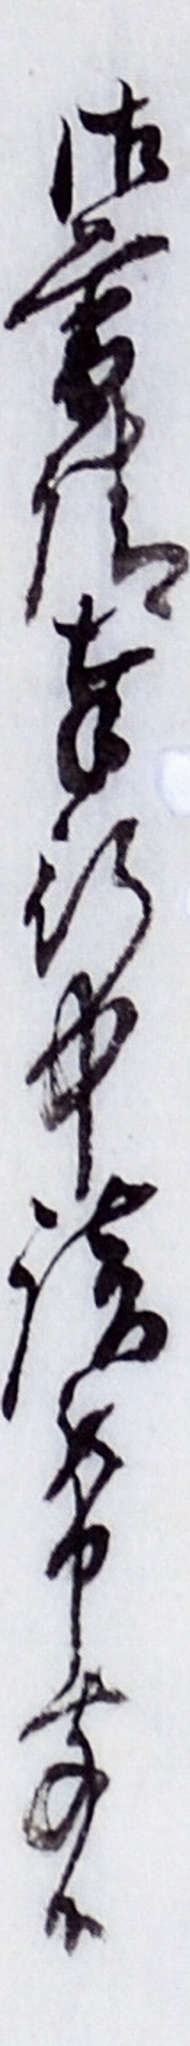御普請奉行中請被申聞候
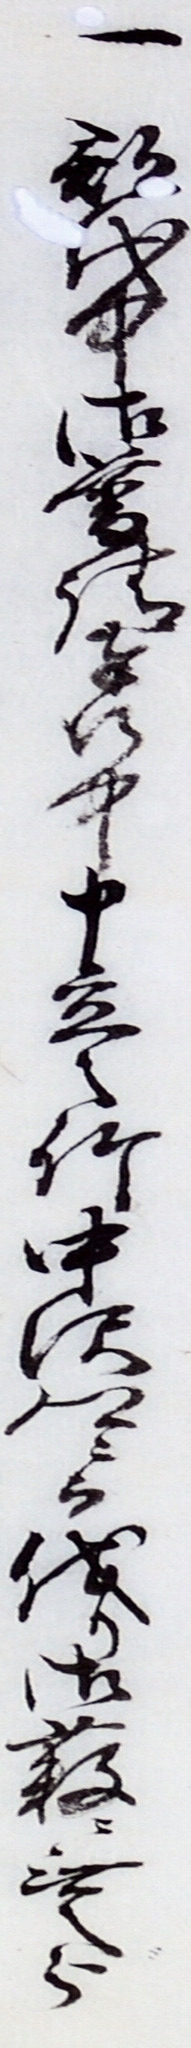一郡代中御普請奉行中申立之竹中沢郷ニ而伐り御藪ニ無之分
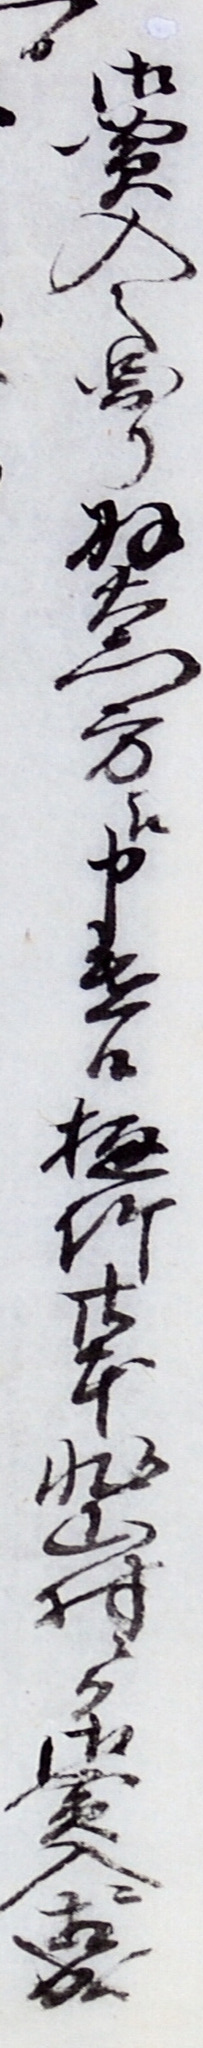御買入之図り羽右衛門方江申遣候樋江竹廿本作山村ニ而御買入ニ相成
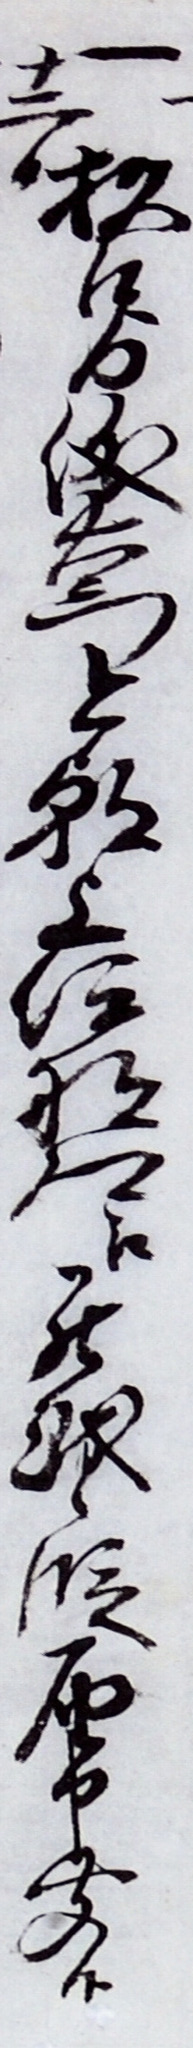一杉左衛門儀右衛門今朝上伊那郷江罷越候段届申聞候
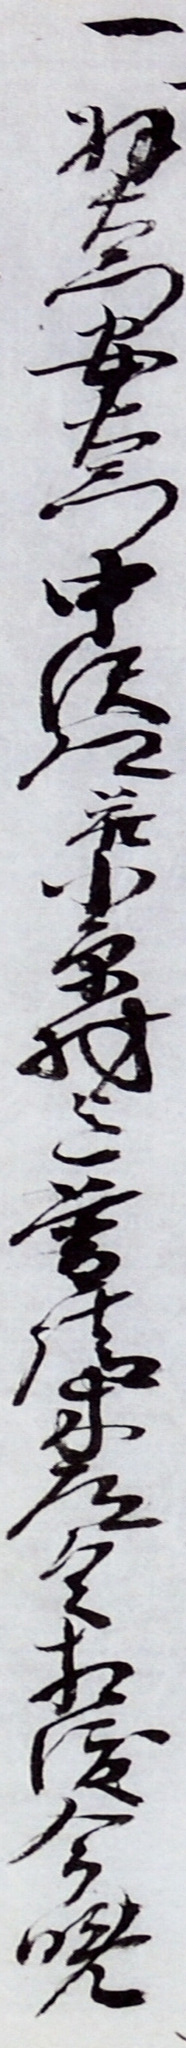一羽右衛門安右衛門中沢郷并小原村迄一普請木道具相渡今晩
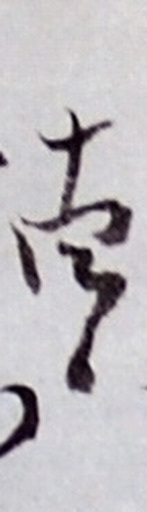十四日
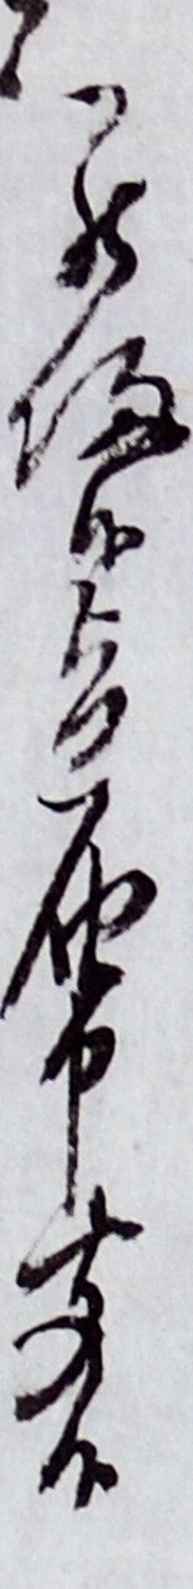罷帰候旨届申聞候
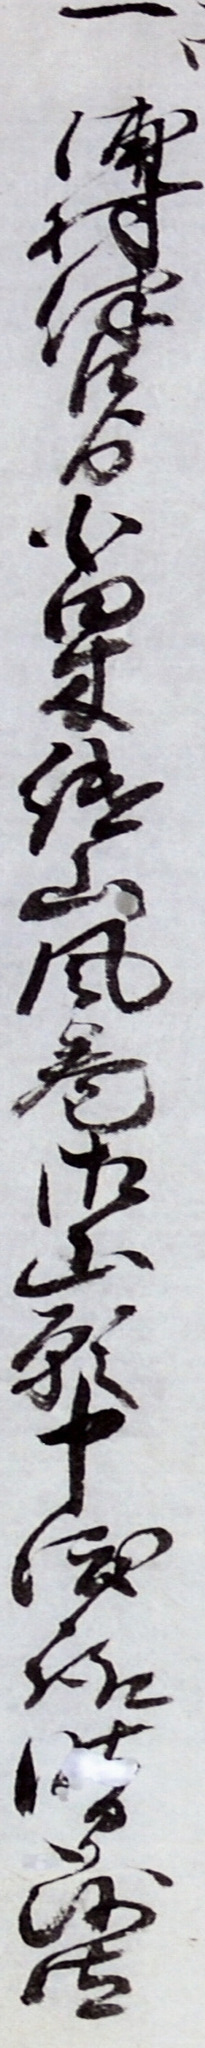一浦村伴左衛門小田木継山風巻御山願申渡候様御沙汰
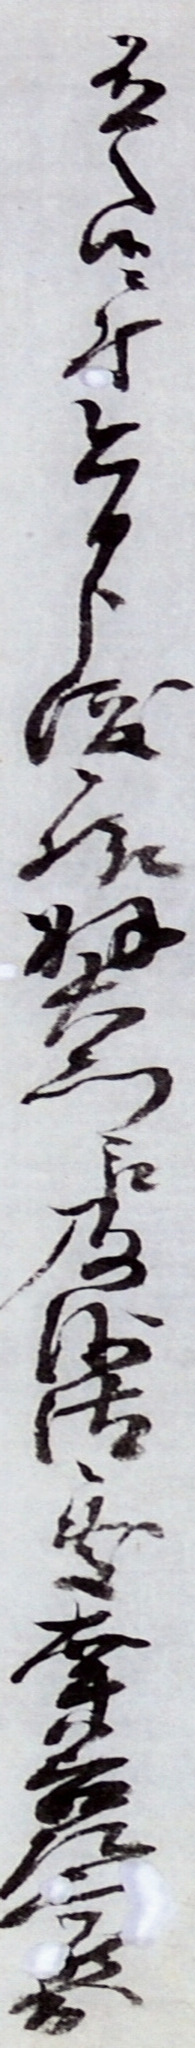有之候ニ付今日申渡候様羽右衛門江及沙汰候処幸蔵方江罷出
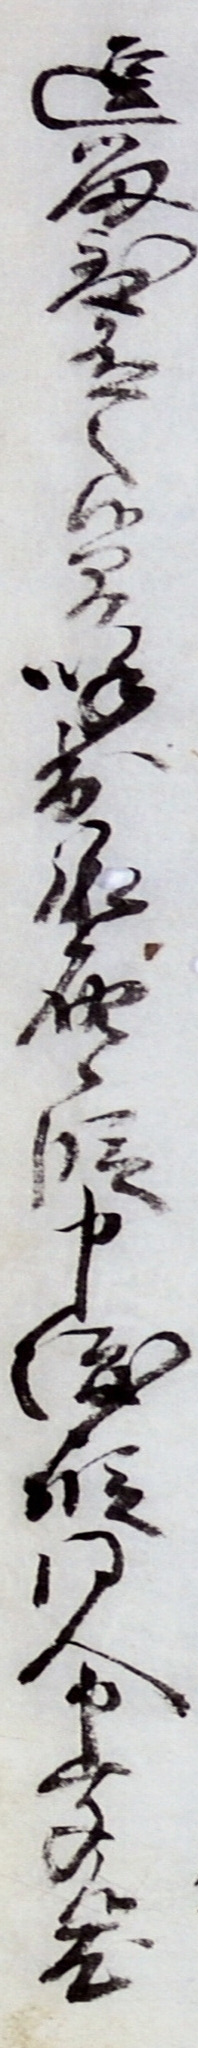逗留度有之候間呼出承届候段申渡段同人申聞候尤

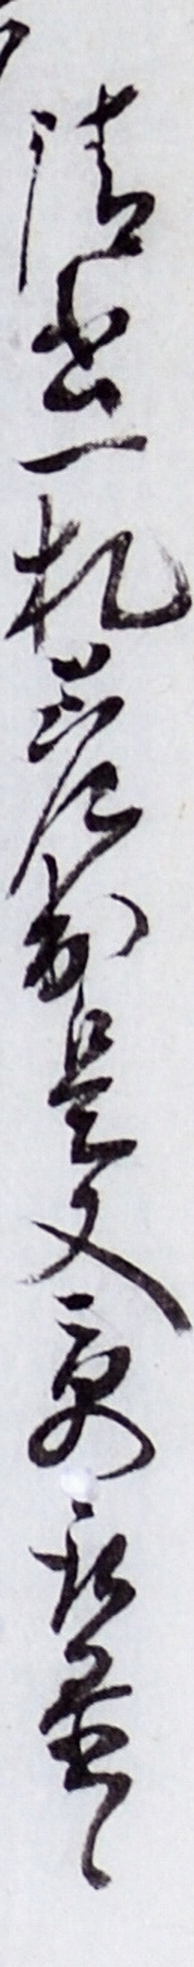請書一札差出是又受取置候
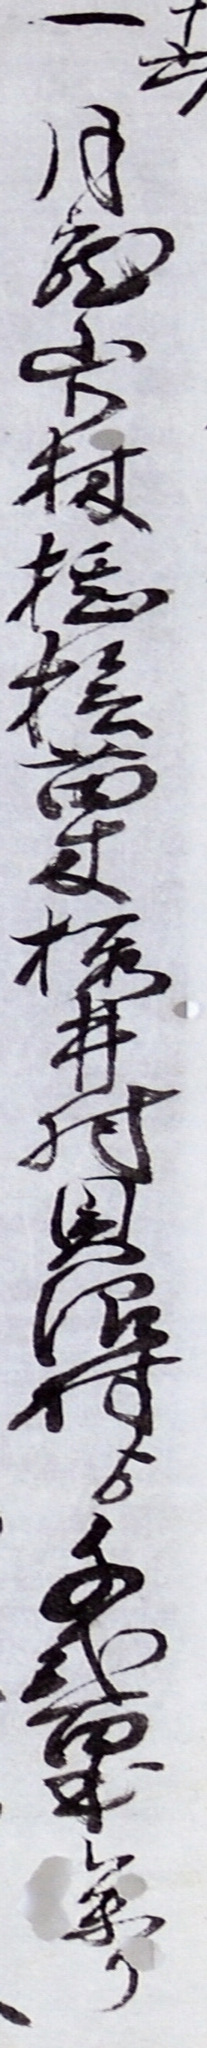一月蔵山下林椹檜苗木桜井村貝沼村より千弐百本参り
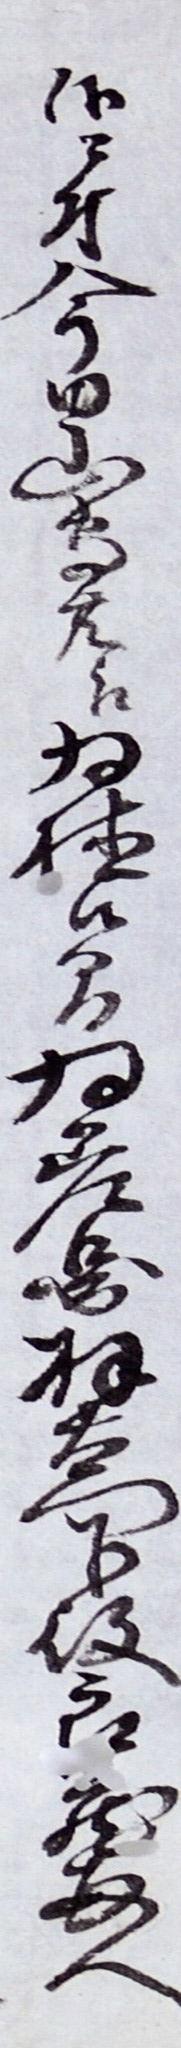候ニ付今日山守共江為植候間為差図羽右衛門下役郎蔵両人
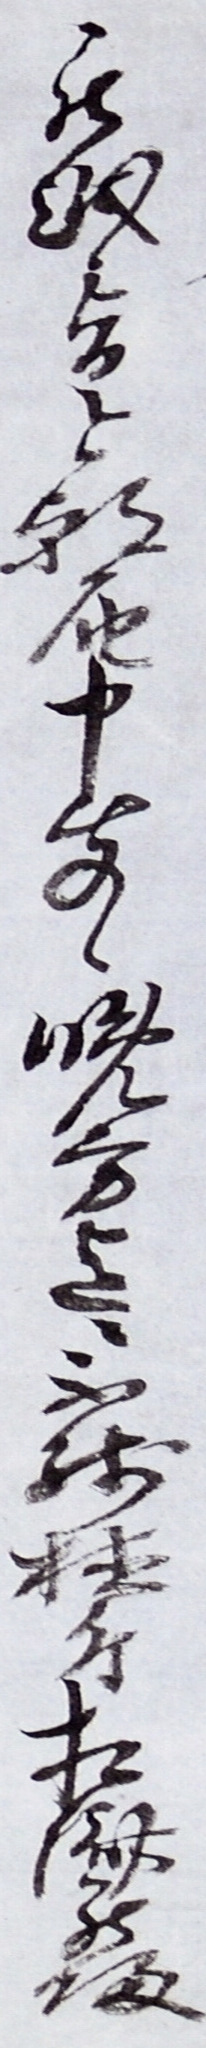罷越候旨し候朝届申聞候晩方迄ニ不残植付相済罷帰
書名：御山奉行御用控
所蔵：伊那市立高遠町図書館・合同会社AMANE
